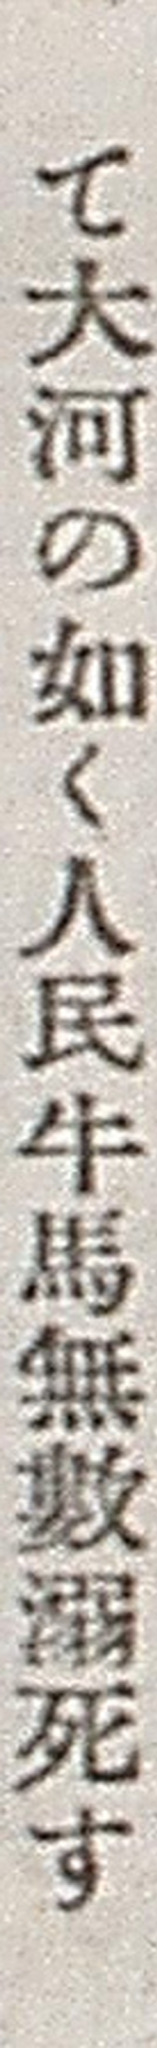て大河の如く人民牛馬無数溺死す
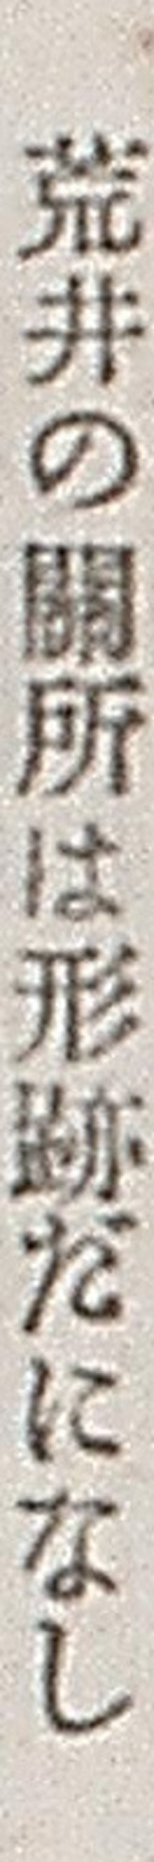荒井の関所は形跡だになし
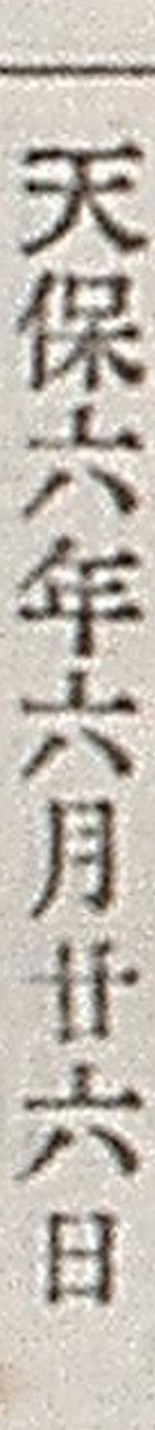天保六年六月廿六日
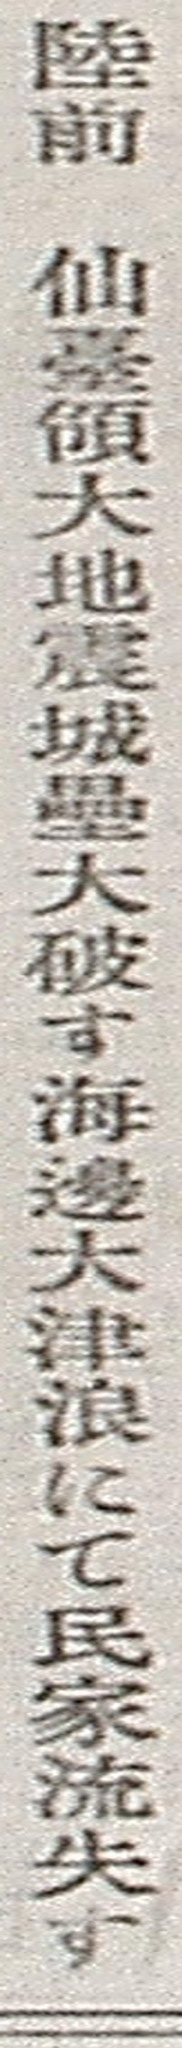陸前仙台領大地震城壘大破す海辺大津浪にて民家流失す
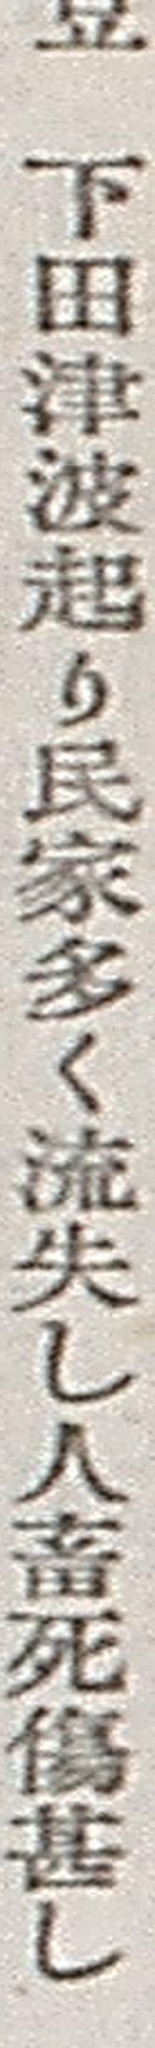伊豆下田津波起り民家多く流失し人畜死傷甚し
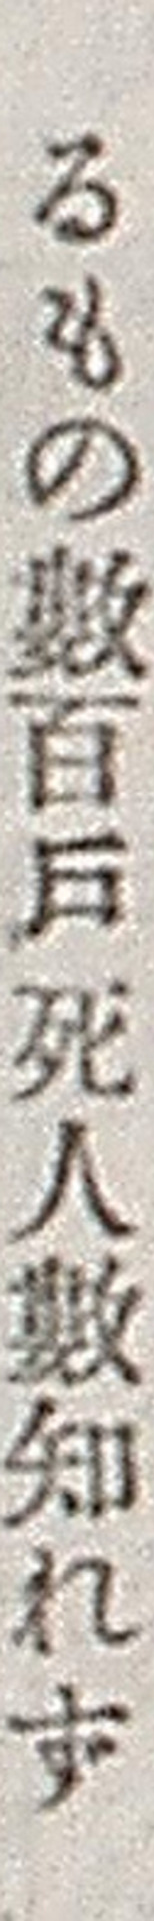るもの数百戸死人数知れず
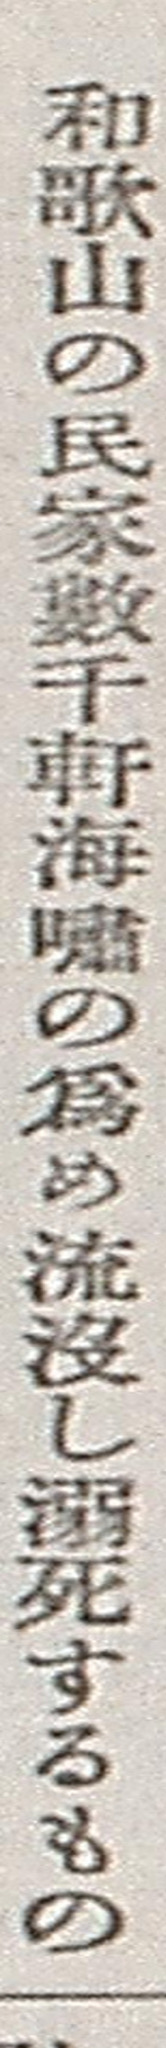紀伊和歌山の民家数千軒海嘯の為め流没し溺死するもの
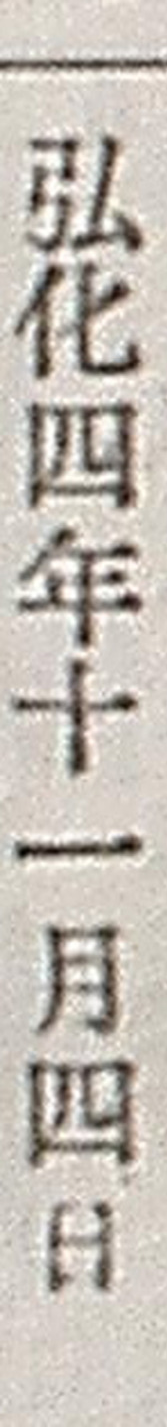弘化四年十一月四日
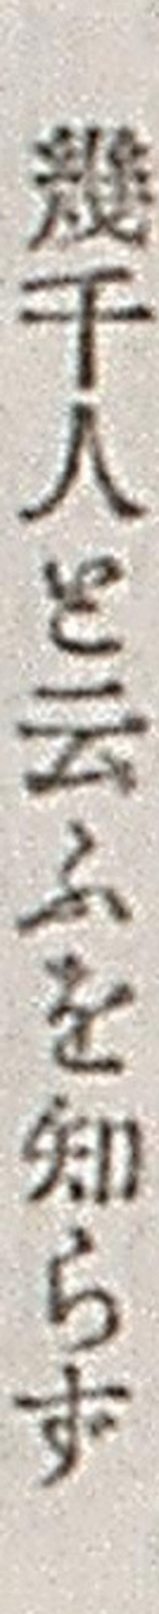幾千人と云ふを知らず
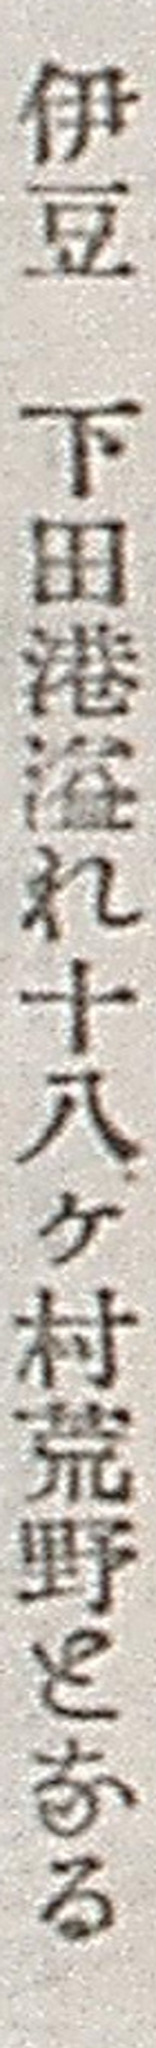伊豆下田港溢れ十八ヶ村荒野となる
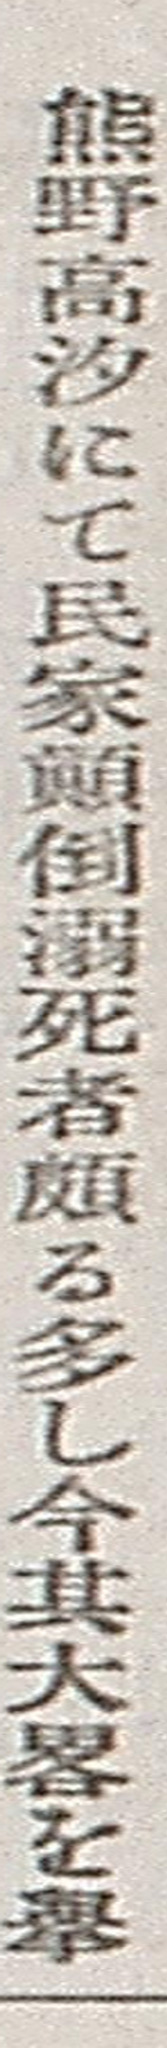熊野高汐にて民家顛倒溺死者頗る多し今其大略を挙
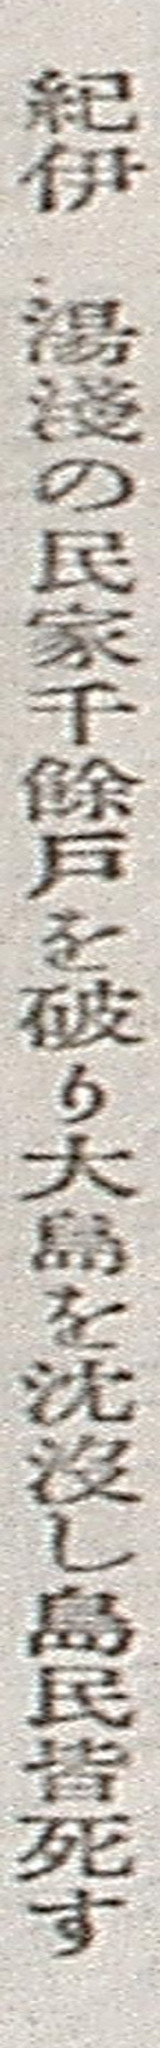紀伊湯浅の民家千余戸を破り大島を沈没し島民皆死す
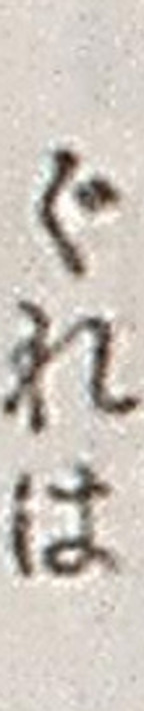ぐれは
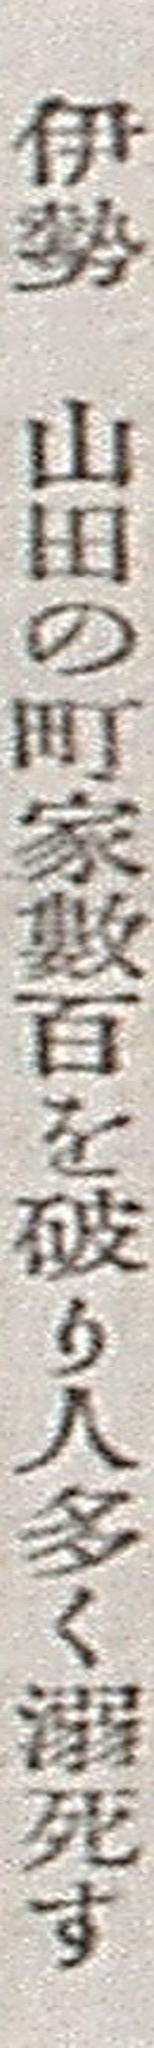伊勢山田の町家数百を破り人多く溺死す
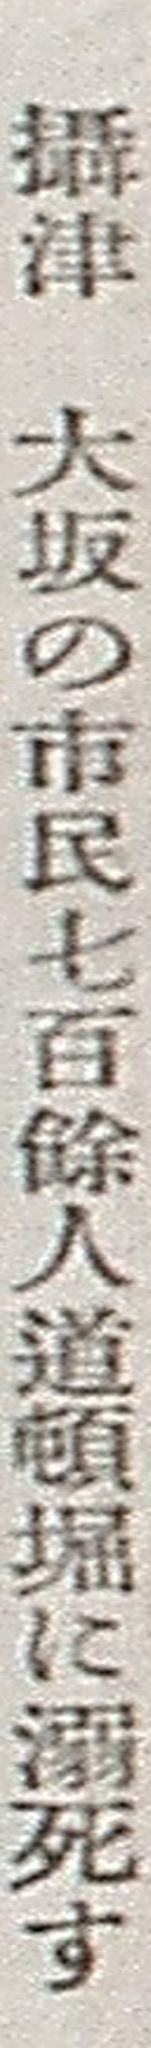摂津大坂の市民七百余人道頓堀に溺死す
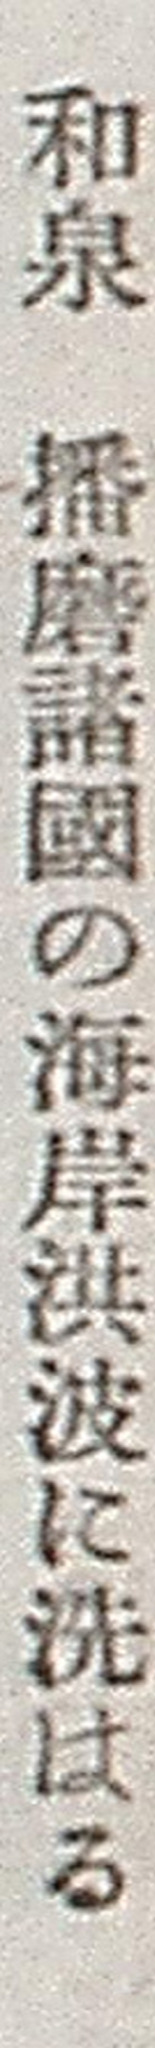和泉播磨諸国の海岸洪波に洗はる
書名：風俗畫報臨時増刊第百二十號　大海嘯被害録（下）
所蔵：東京大学地震研究所図書室 Earthquake Research Institute Library, The University of Tokyo, JAPAN
